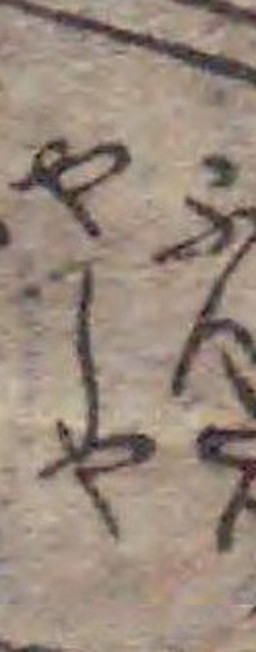やしや
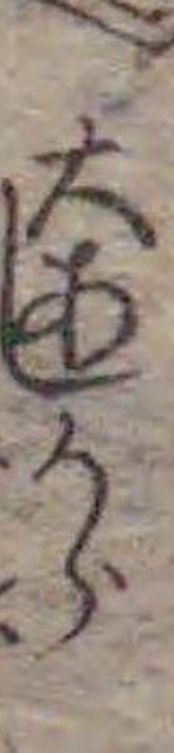大あしから
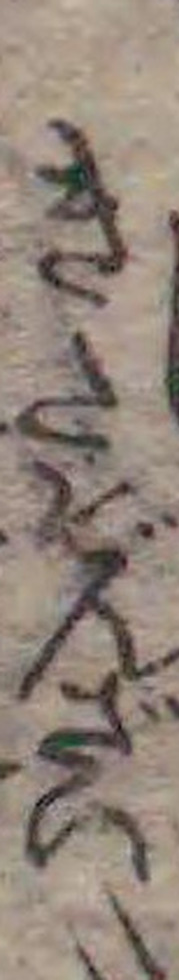きたぞんざい
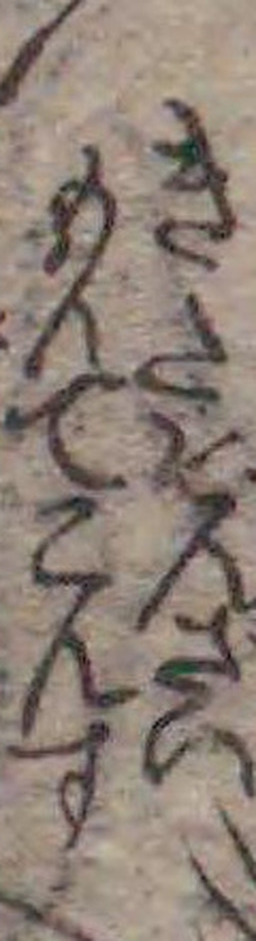もんてこんす
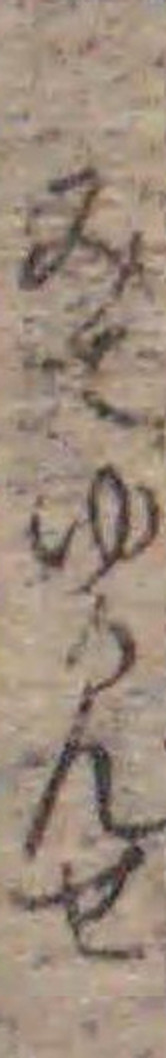みてゆかんせ

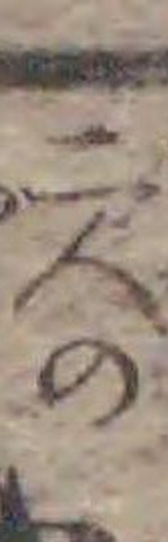二人の
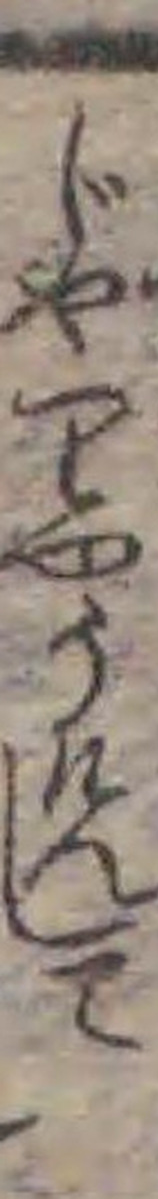じやりやうけんして
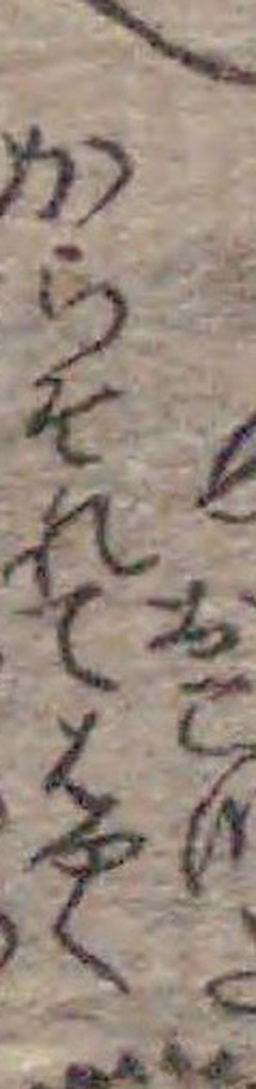からそれてはやく
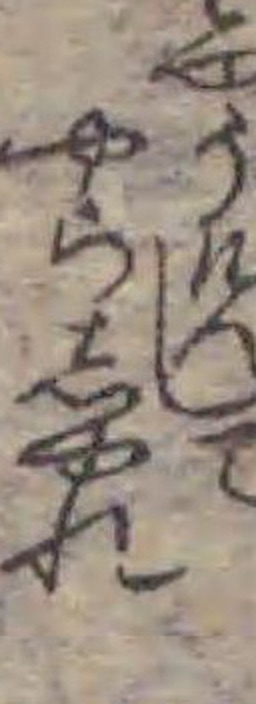やらしやれ
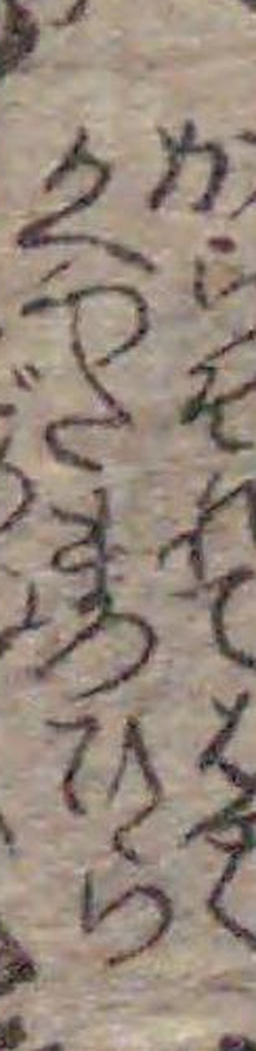かへつたまつひら
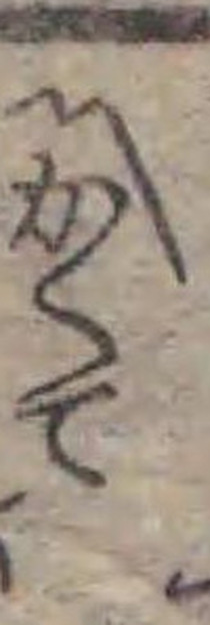〽かくて
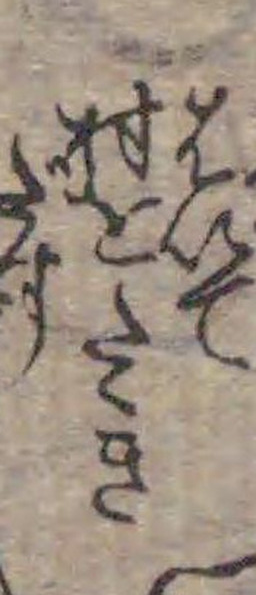村をたゝき
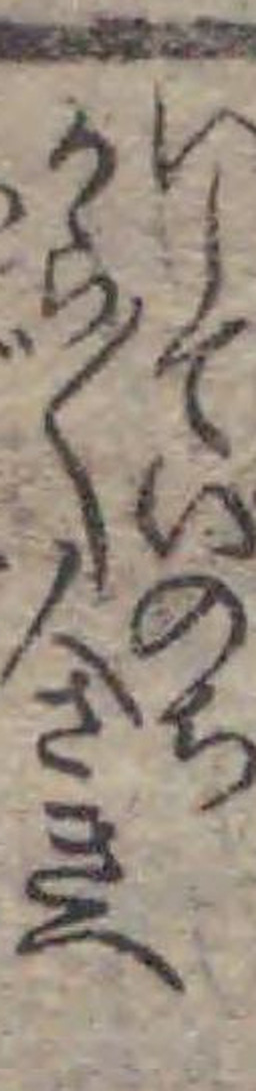から〳〵人さきへ
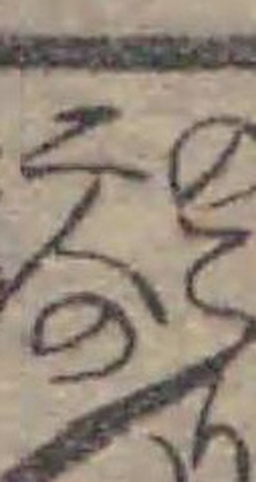二人の
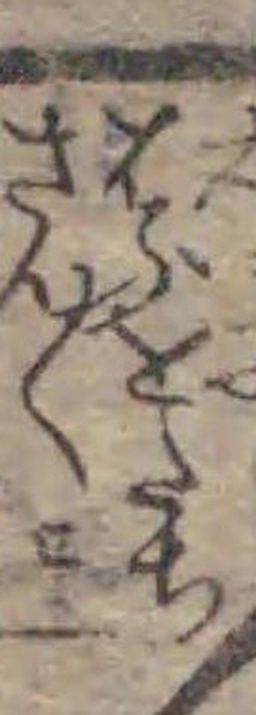さん〳〵に
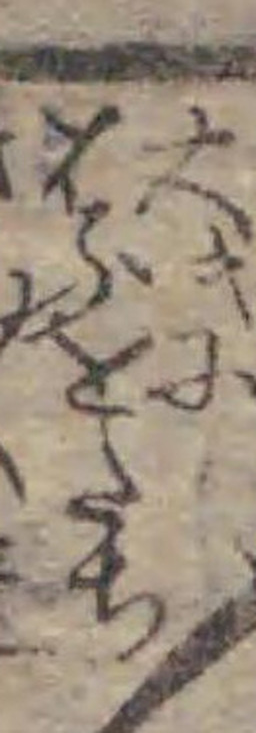はらをたち
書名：歌の化物一寺再興 : 2巻
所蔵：国立国会図書館 National Diet Library, JAPAN
